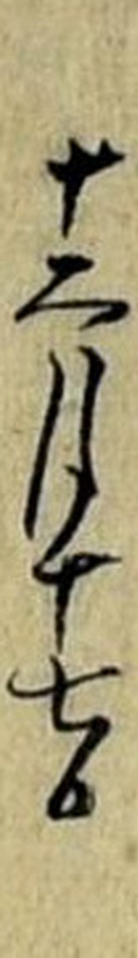十二月十七日
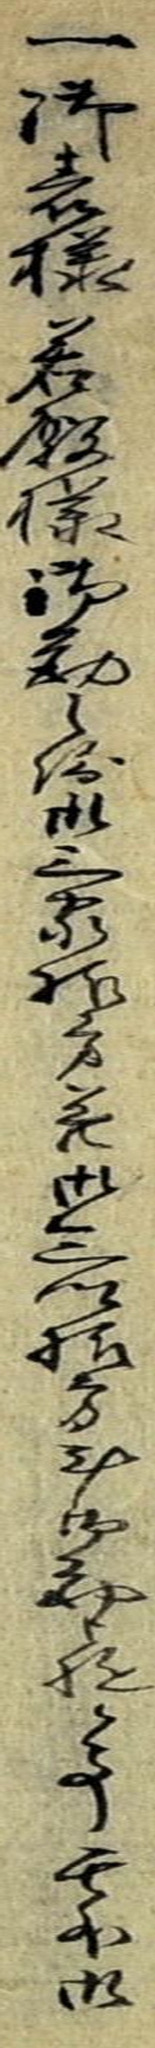一御表様若殿様御勤之儀御三家様方并御三卿様方斗御勤被遊候事其外御
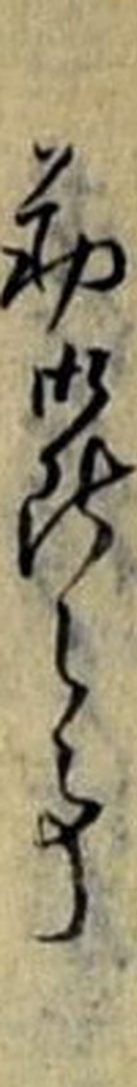勤御断候事
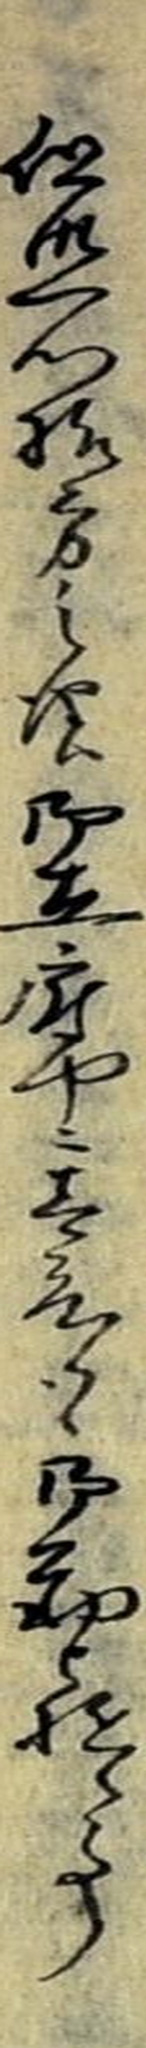但御一門様方之儀ハ御在府中ニ壱度ツヽ御勤被遊候事
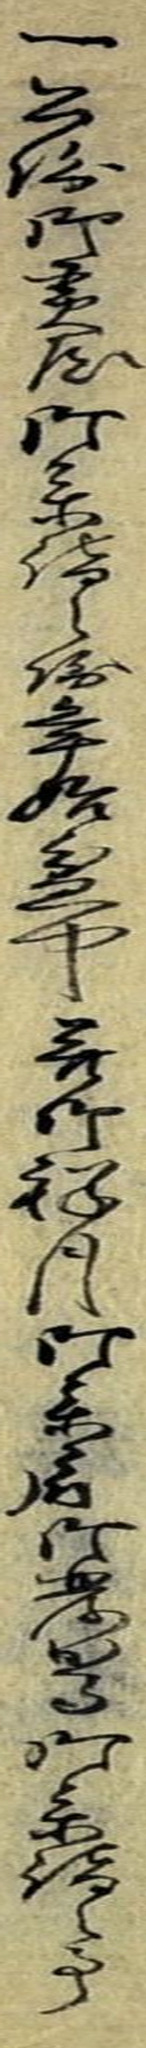一公儀御灵屋御参詣之儀年始盆中并御祥月御参府御発駕御参詣之事
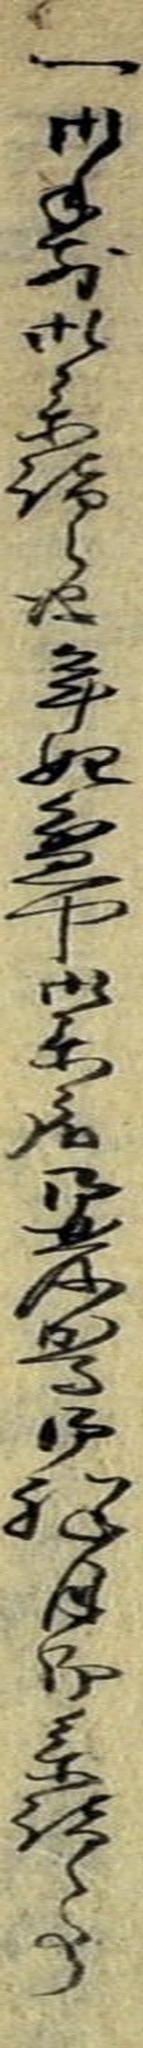一御手前御参詣之儀年始盆中御参府御発駕御祥月御参詣之事
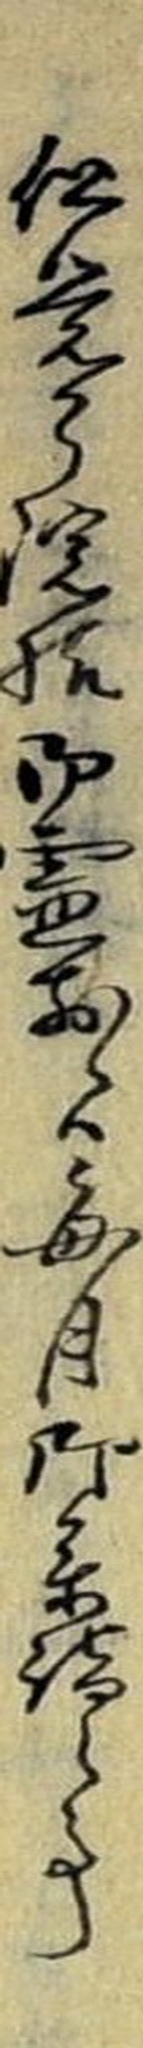但覚了院様御霊前ヘハ毎月御参詣之事
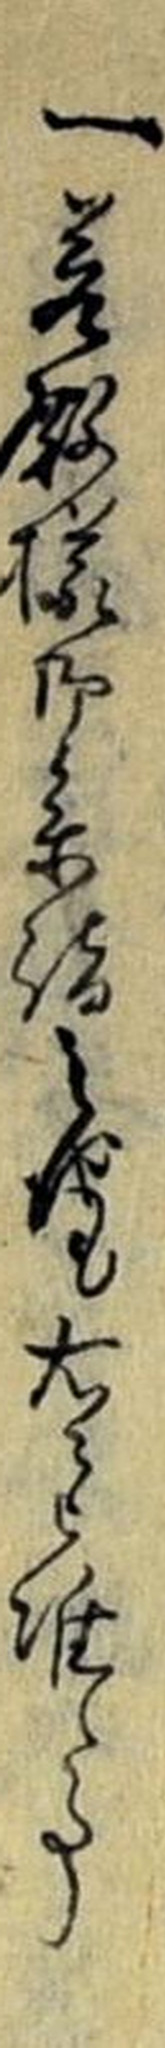一若殿様御参詣之儀も右ニ被准候事
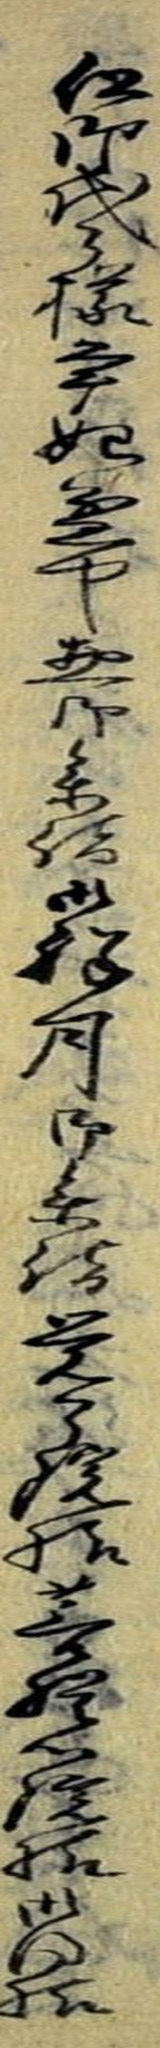但御代々様年始盆中惣御参詣御祥月御参詣覚了院様菩提心院様？御同様
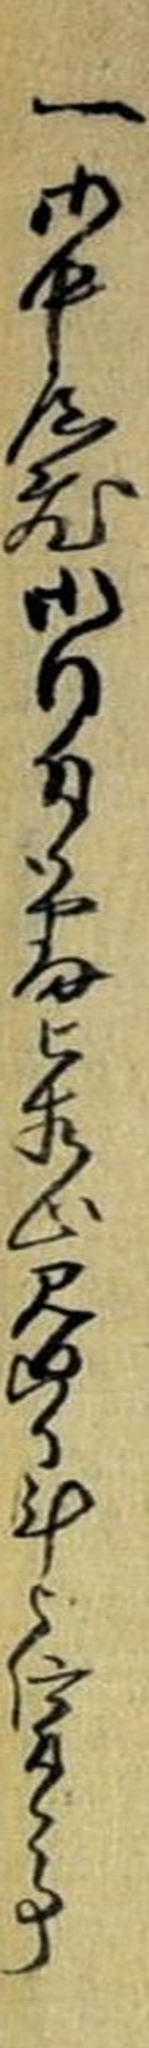一御中屋敷御目付御番被相止見廻り斗被仰付候事
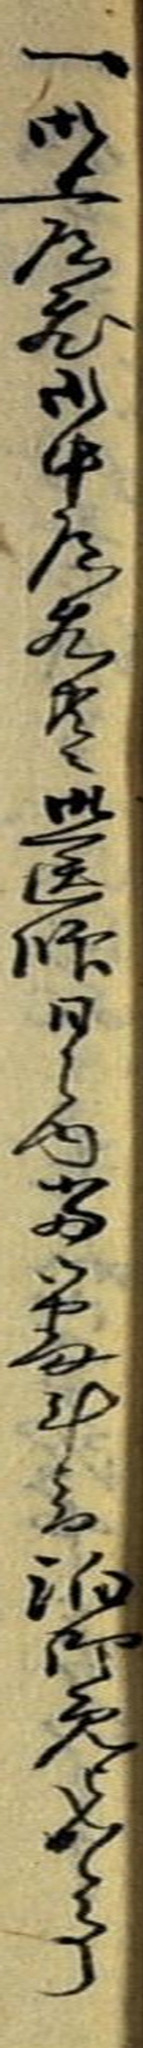一御上屋敷御中屋敷共ニ御医師日之内当御番斗ニ而泊御免被成候事
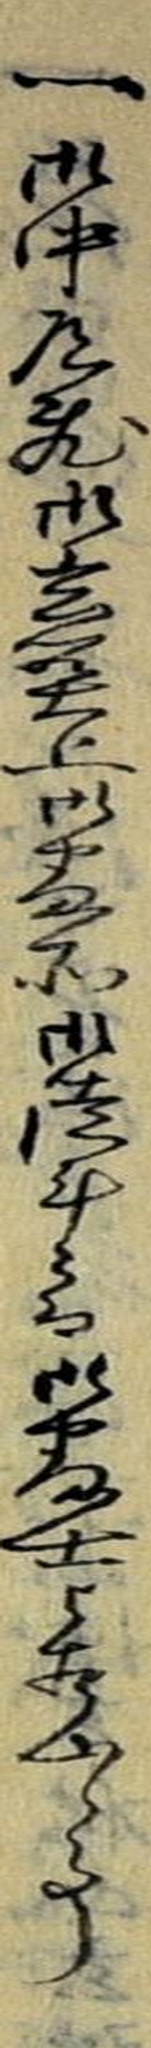一御中屋敷御玄関上御番所御徒斗ニ而御番士被相止候事
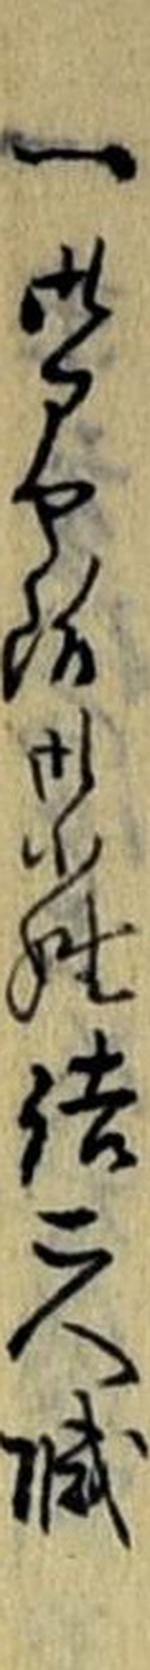一御部屋附御小姓詰二人減
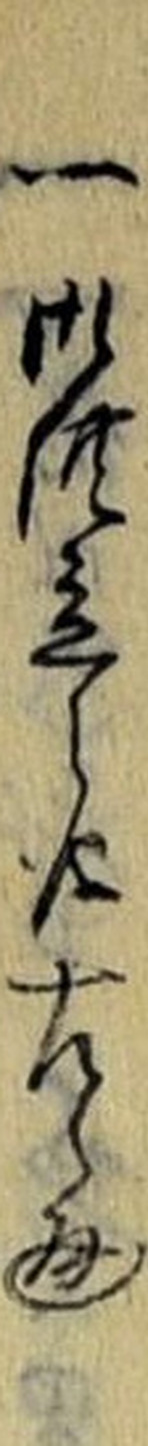一御供立之儀左之通
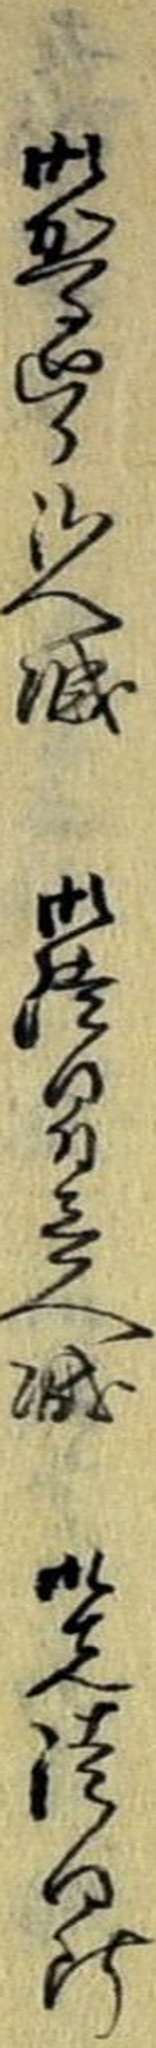御駕廻り弐人減御徒目付壱人減御先徒同断
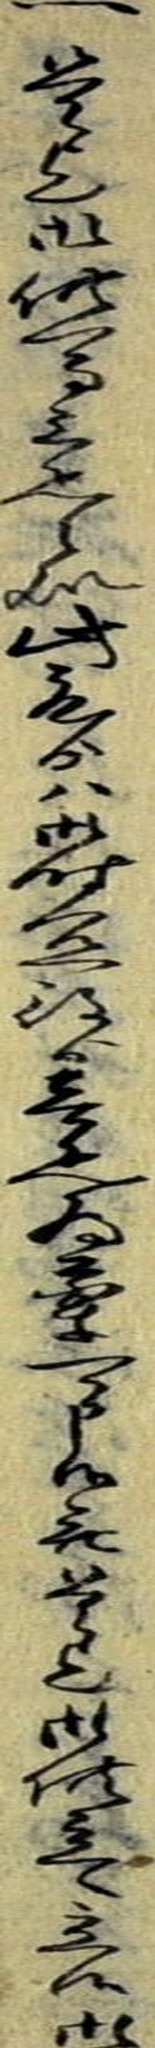一是迄御供馬三疋之処此度ゟハ御時宜役ゟ壱疋為牽可申候并是迄御供立へ立候御
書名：命令之部 三
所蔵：福井県文書館 Fukui Prefectural Archives
